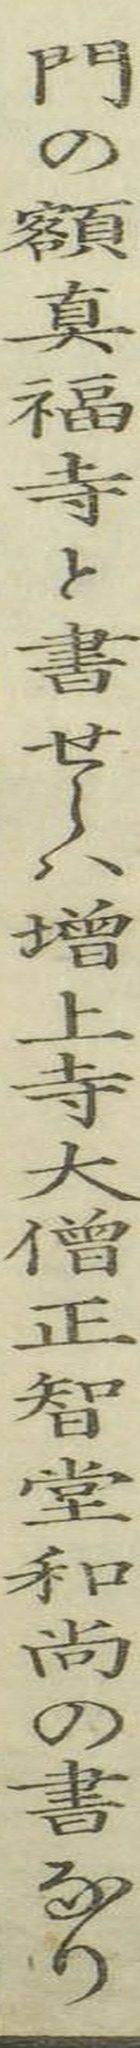門の額真福寺と書せしは増上寺大僧正智堂和尚の書なり

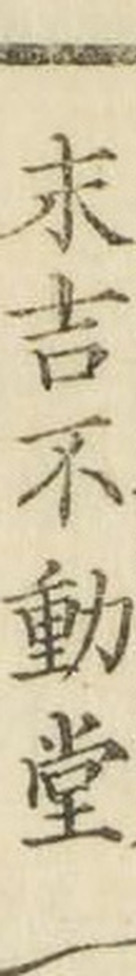末吉不動堂
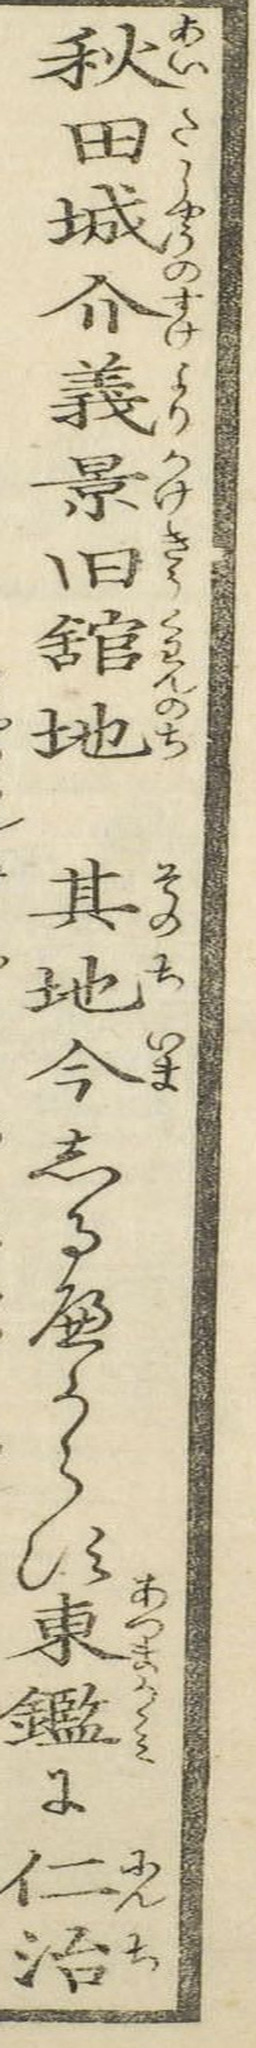秋田城之介義景旧館地其地今しるへからす東鑑に仁治
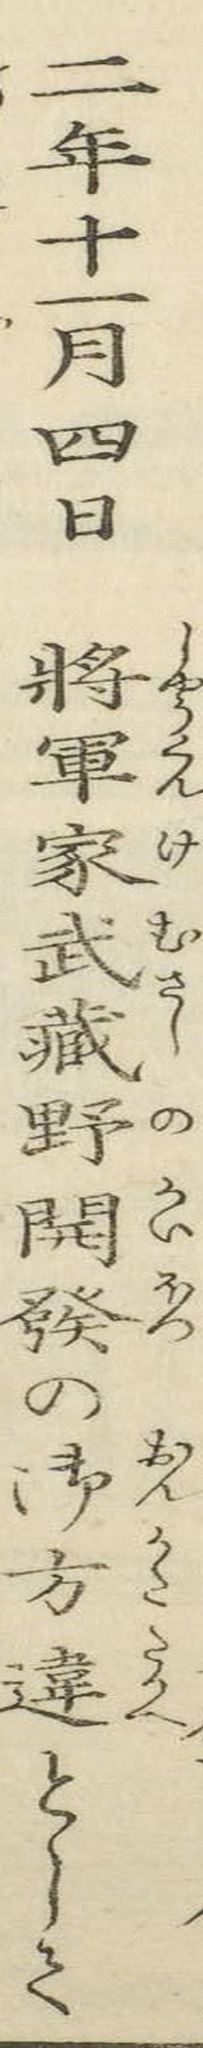二年十一月四日将軍家武蔵野開發の御方違として
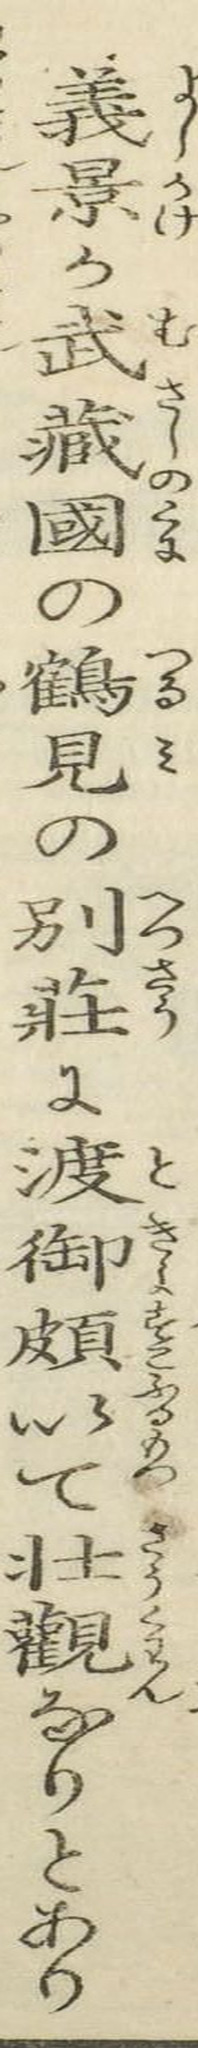義景か武蔵國の鶴見の別荘に渡御頗以て壮観なりとあり
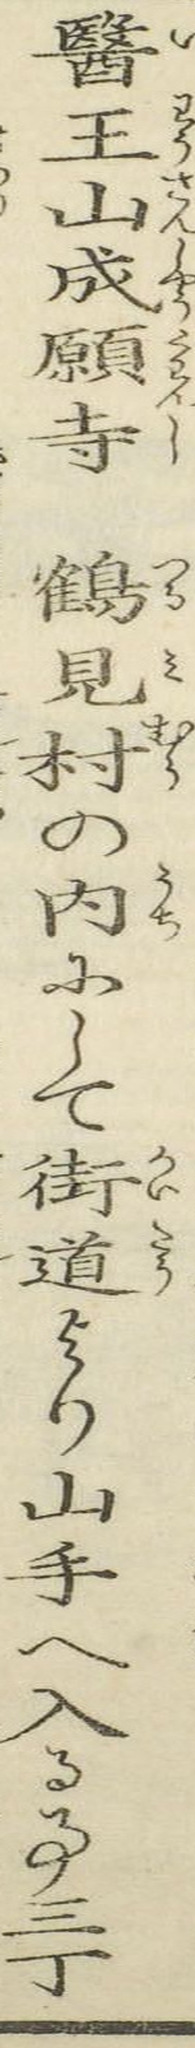醫王山成願寺鶴見村の内にして街道より山手へ入る事三丁
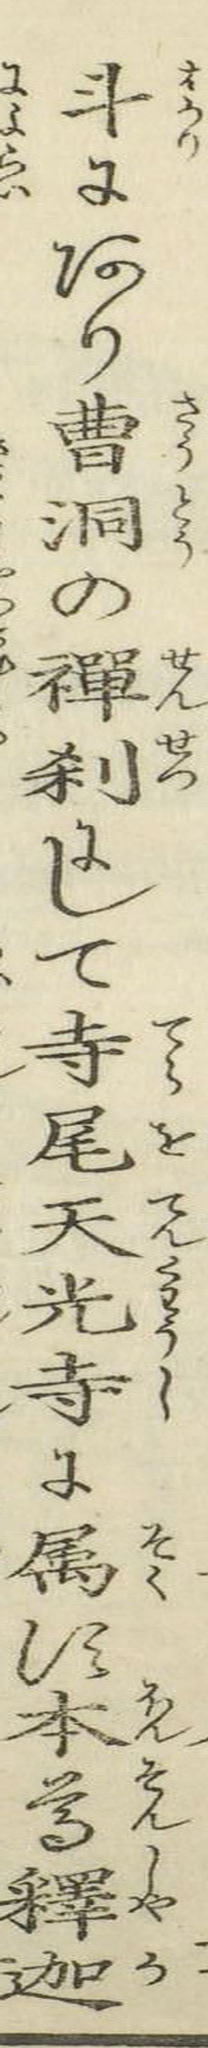斗にあり曹洞の禅刹にして寺尾天光寺に属す本尊釋迦
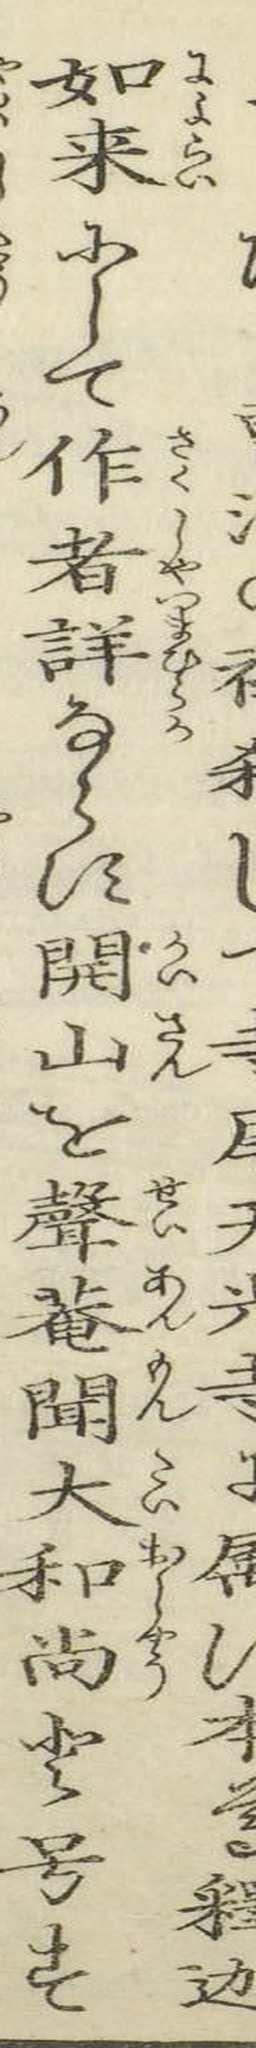如来にして作者詳ならす開山を聲菴聞大和尚と号す
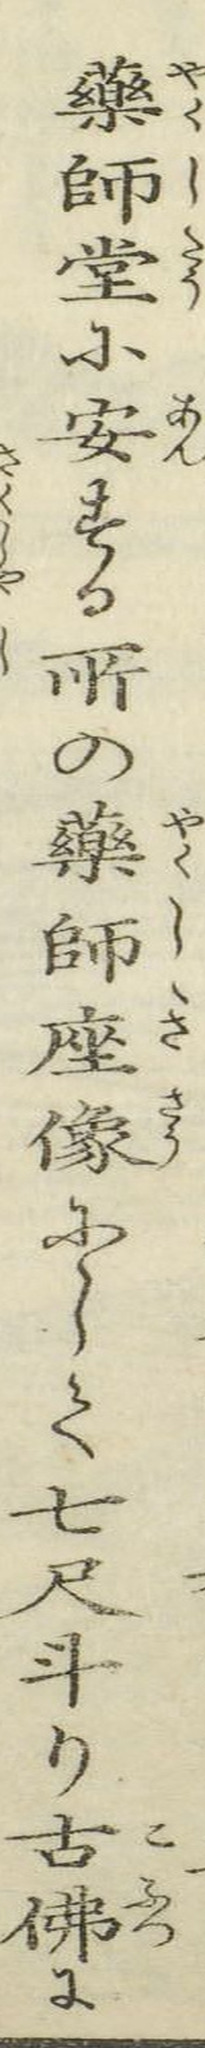薬師堂に安する所の薬師座像にして七尺斗り古佛に
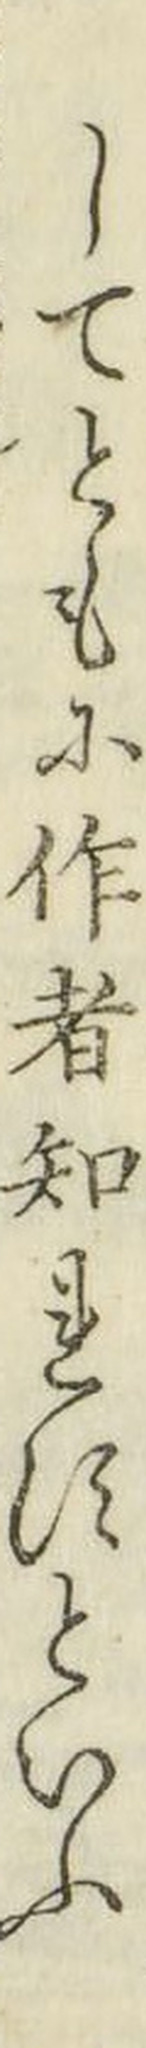してともに作者知れすといふ
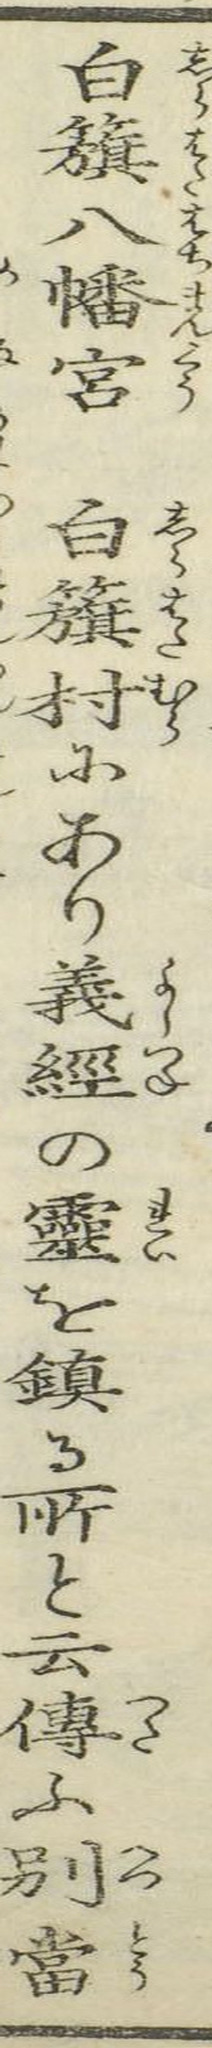白籏八幡宮白籏村にあり義経の霊を鎮る所と云傳ふ別當
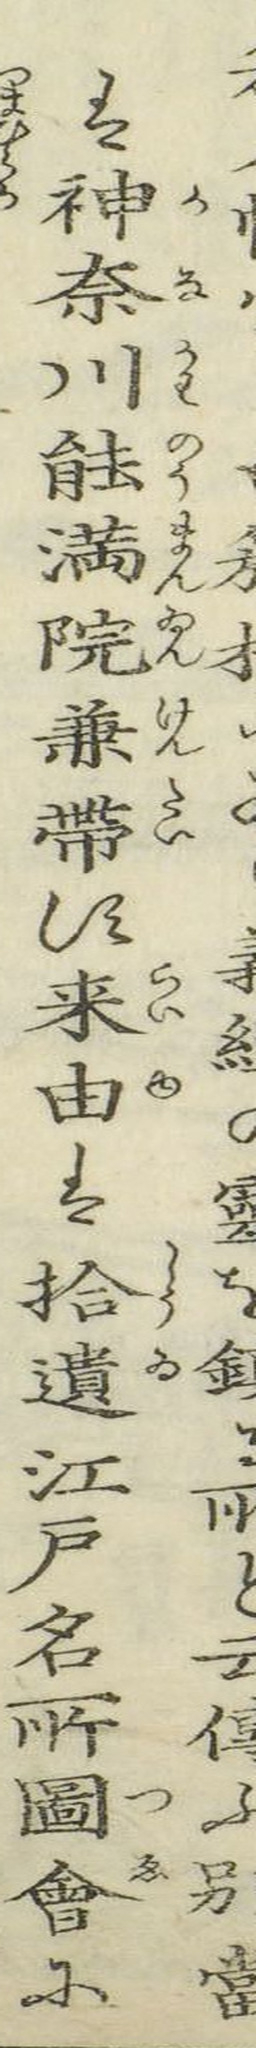は神奈川能満院兼帯す来由は拾遺江戸名所圖會に
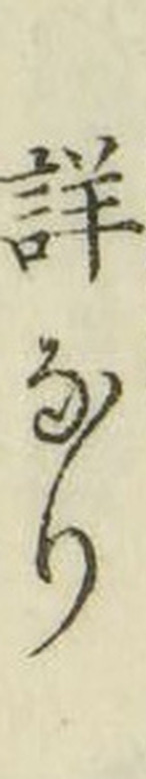詳なり
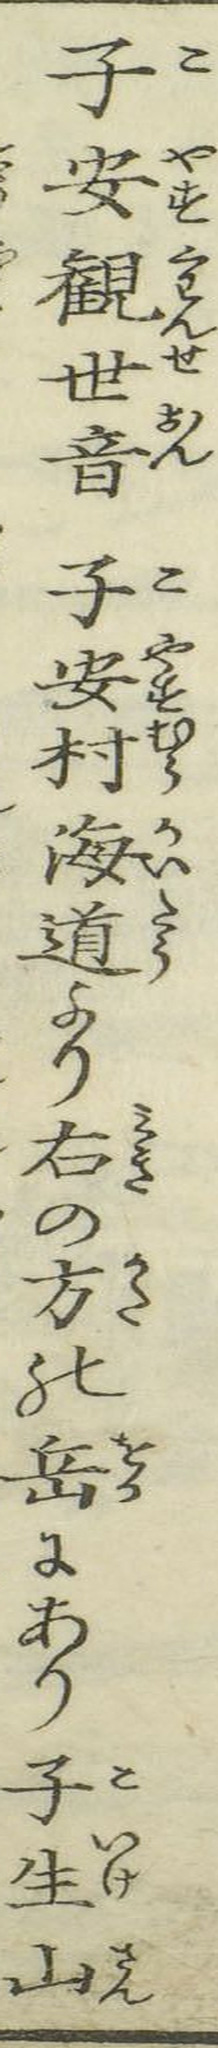子安観世音子安村海道より右の方の岳にあり子生山
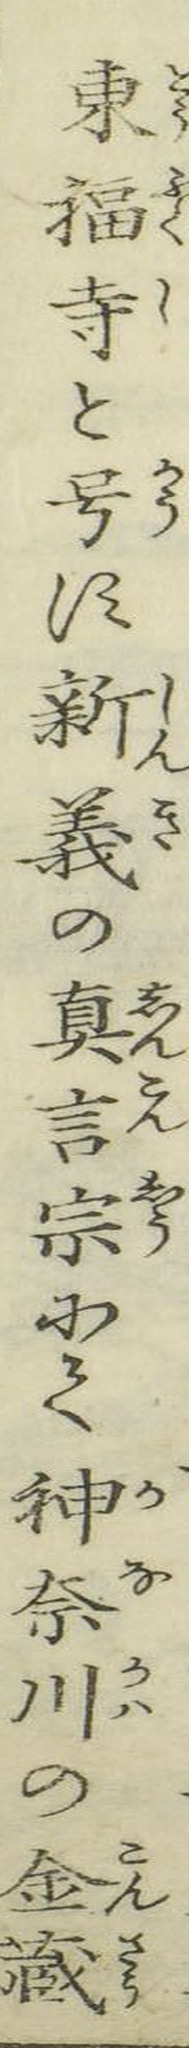東福寺と号す新義の真言宗にて神奈川の金蔵

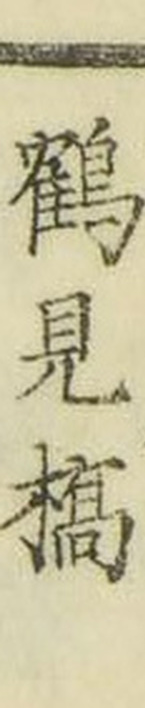鶴見橋
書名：江戸名所図会 20巻 巻之5
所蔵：東京学芸大学教育コンテンツアーカイブ
